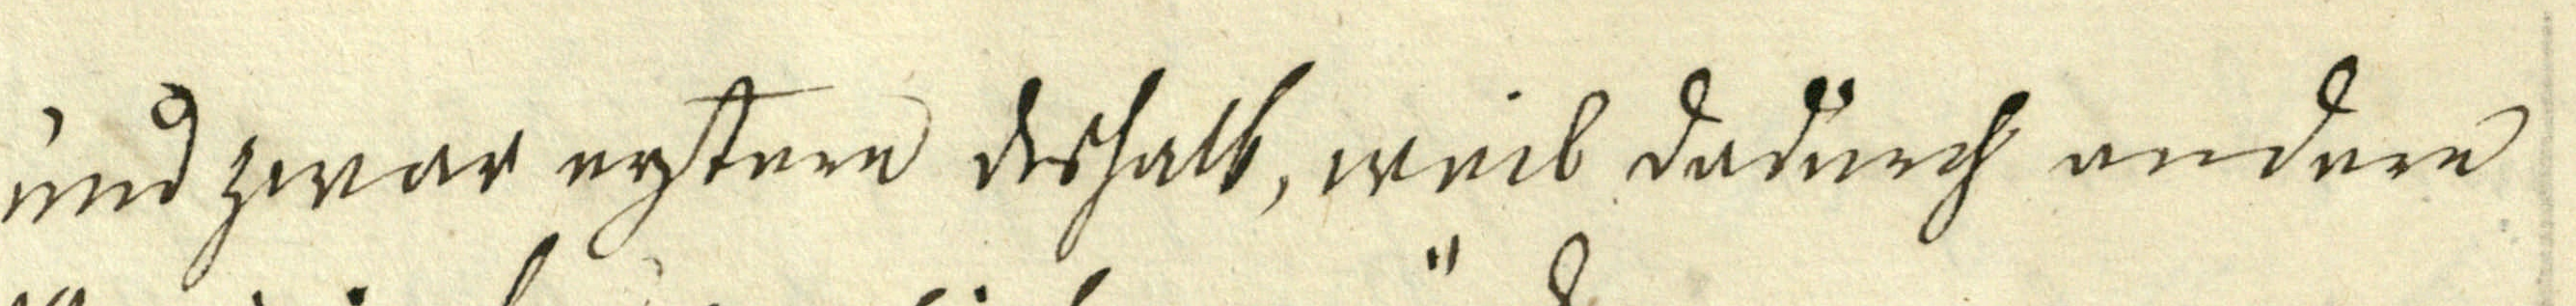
und zwar erstern deshalb, weil dadurch andern
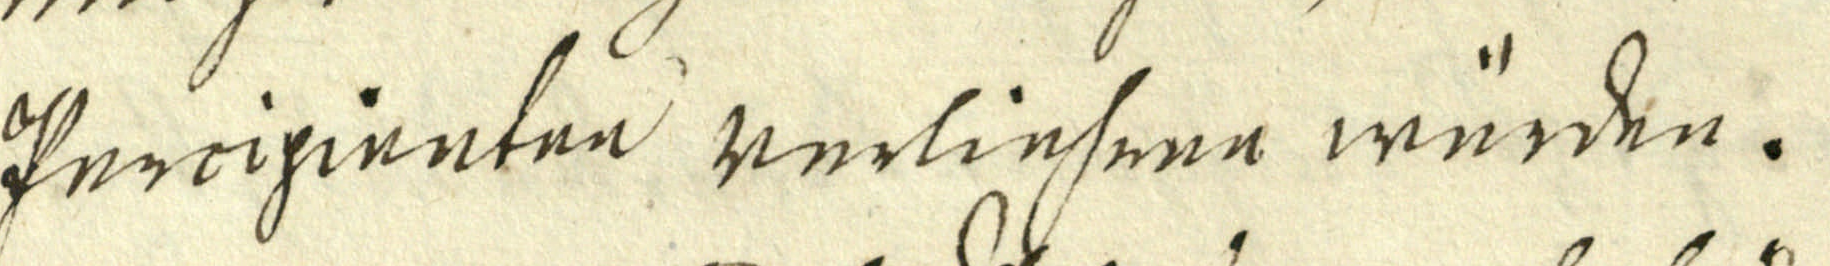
Percipienten verliehene würden.
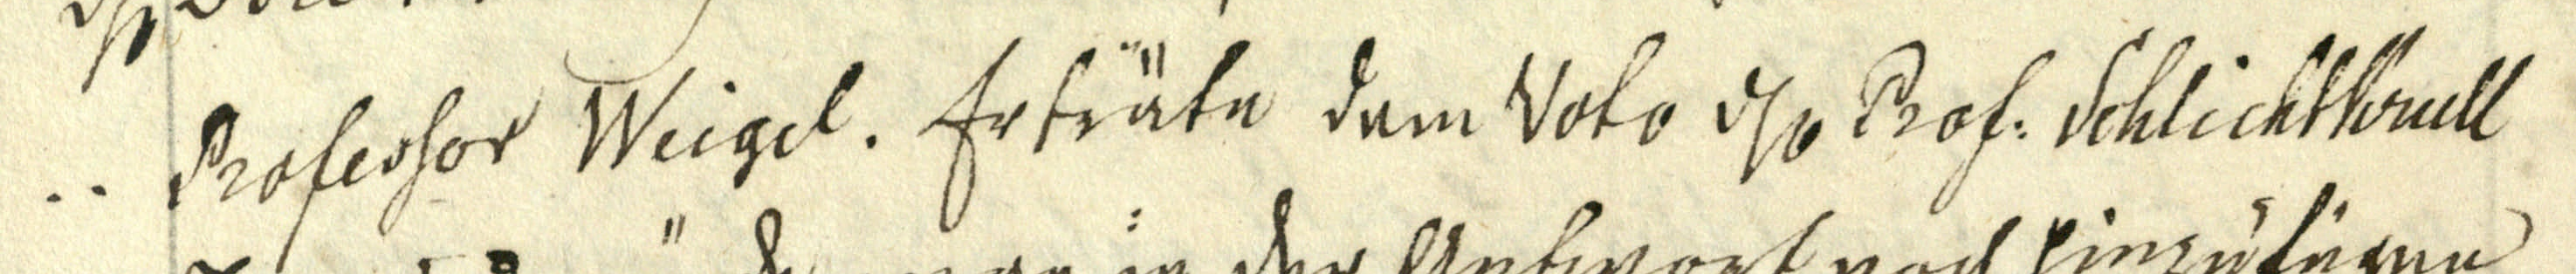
Professor Weigel. Er träte dem Voto dh Prof. Schlichtkrull
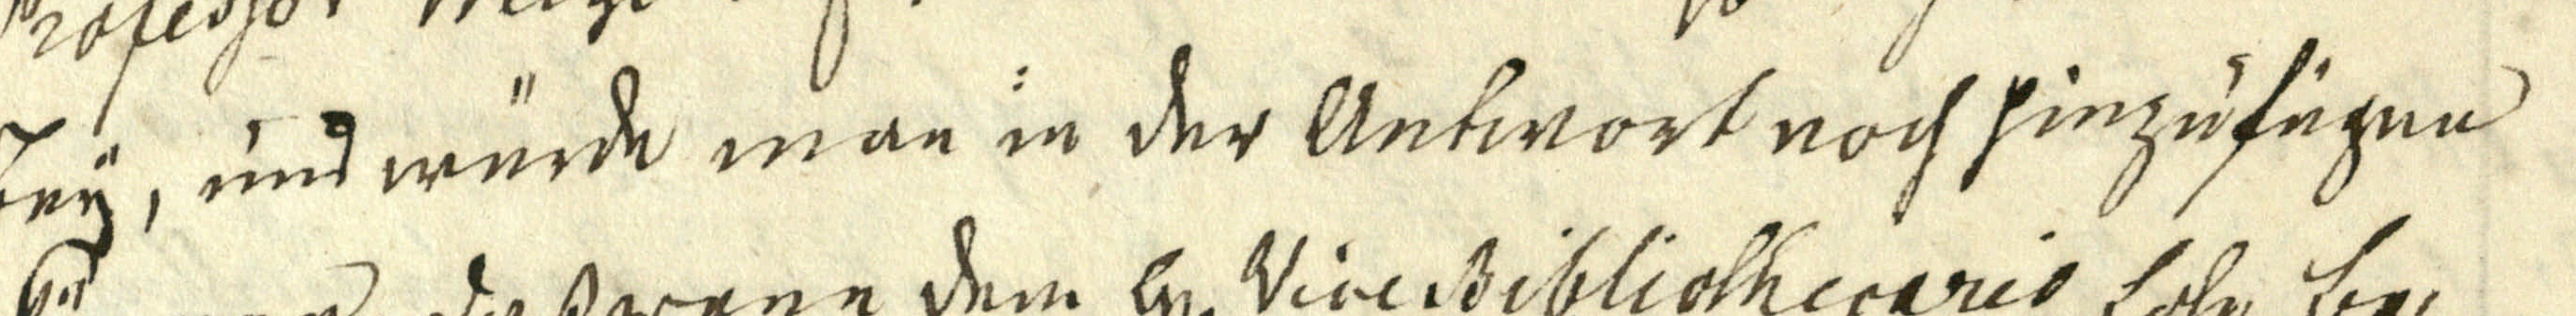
beÿ, und würde man in der Antwort noch hinzufügen
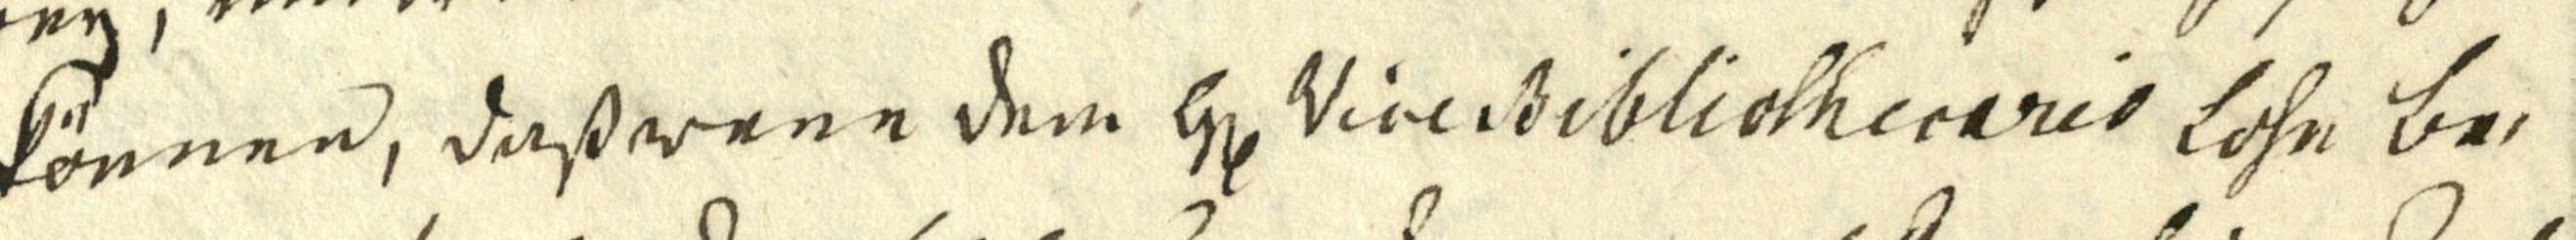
können, daß wenn dem H Vice Bibliothecario Lohn be¬
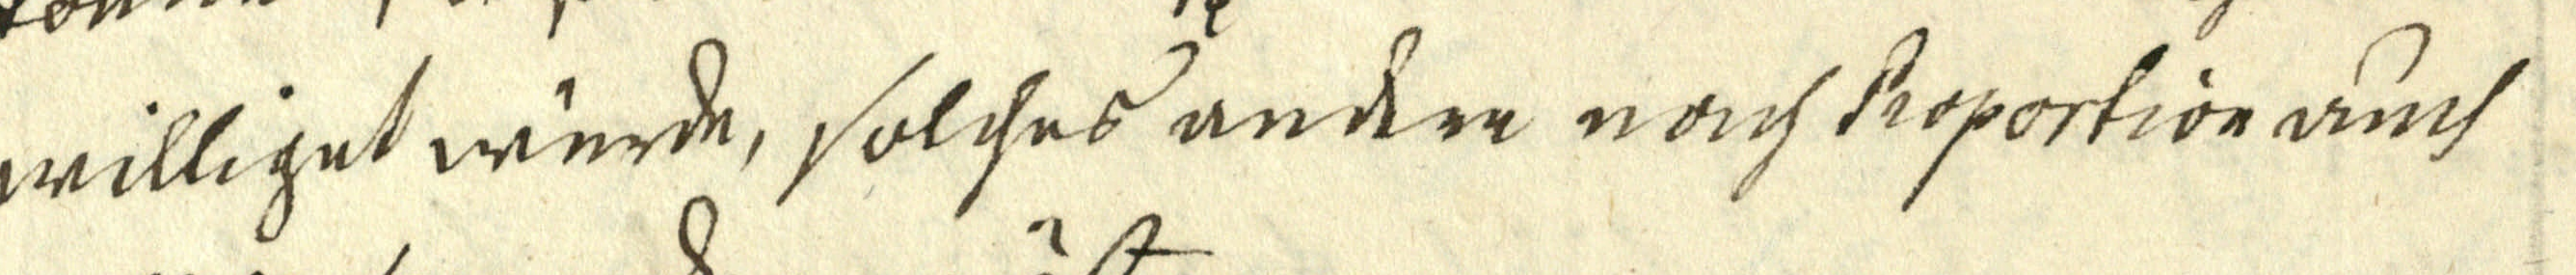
williget würde, solches andern nach Proportion auch
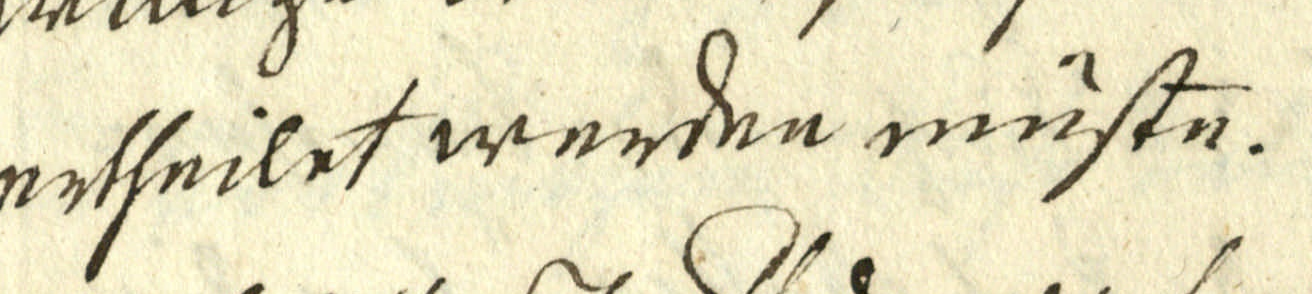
ertheilet werden müste.
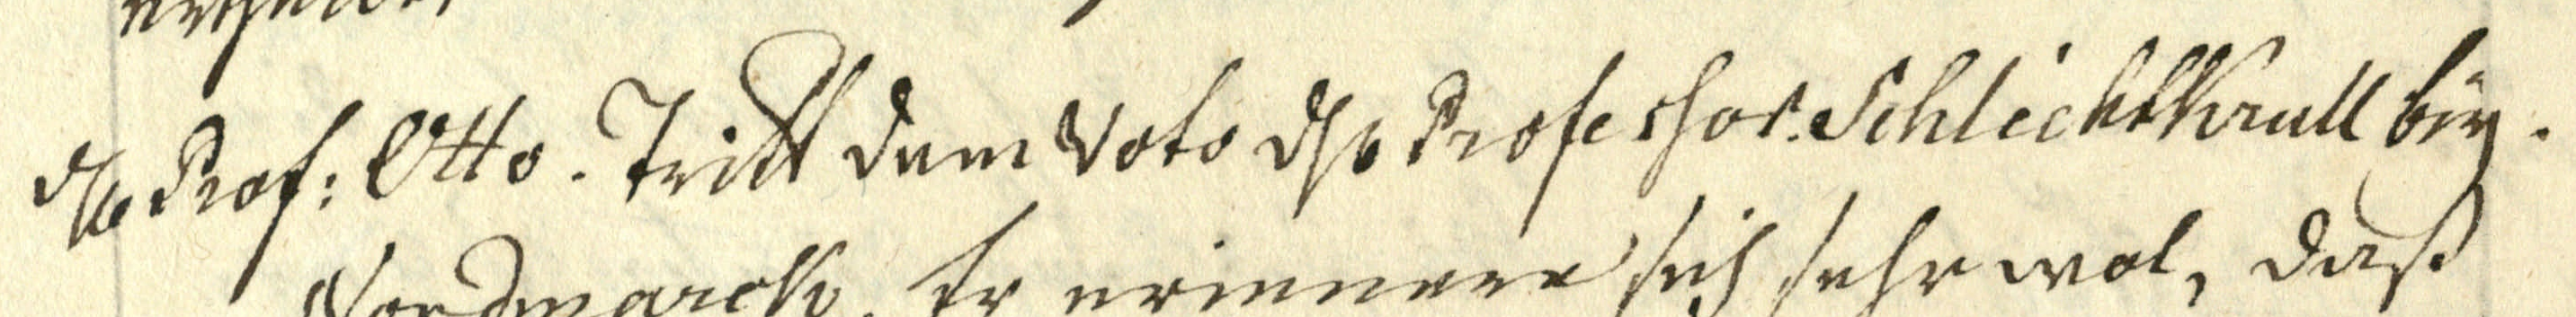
dh. Prof. Otto Tritt dem Voto dh Professor Schlichtkrull beÿ.
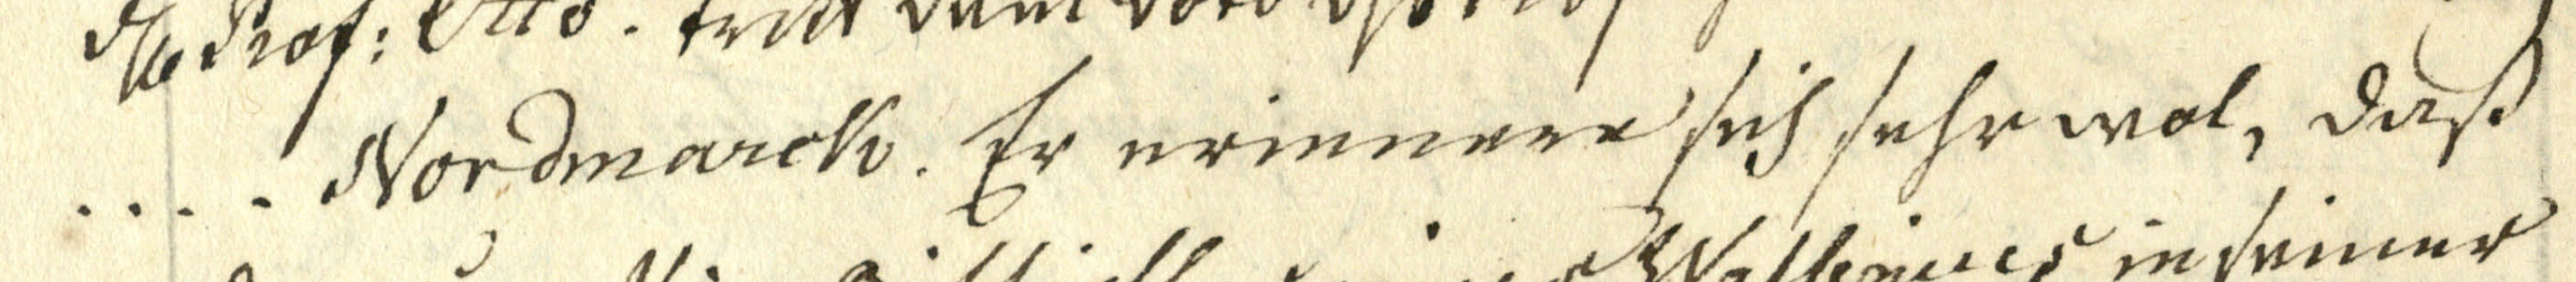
Nordmarck. Er erinnere sich sehr wol, daß
